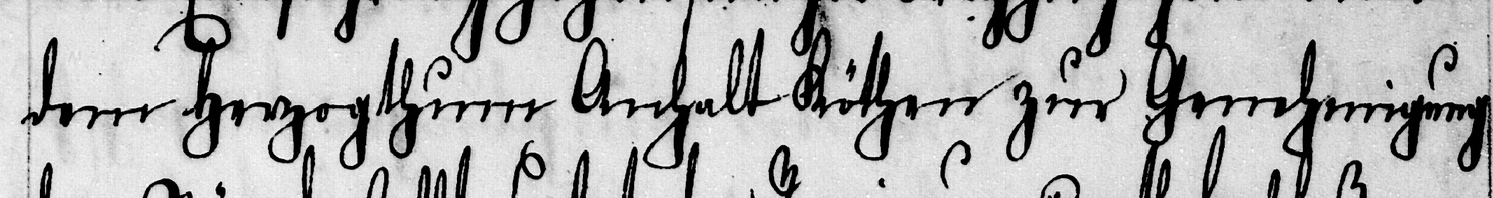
dem Herzogthum Anhalt Köthen zur Genehmigung
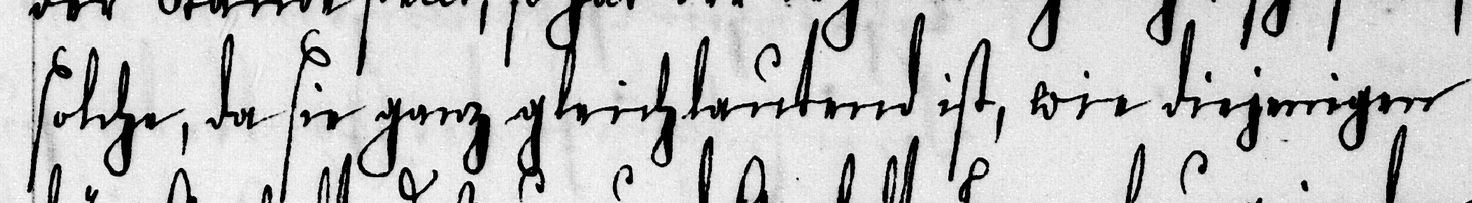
solche, da sie ganz gleichlautend ist, wie diejenigen
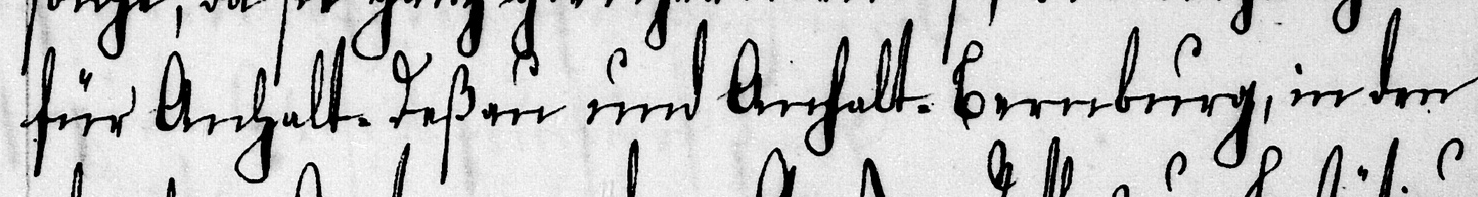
für Anhalt-Deßau und Anhalt-Bernburg, in den
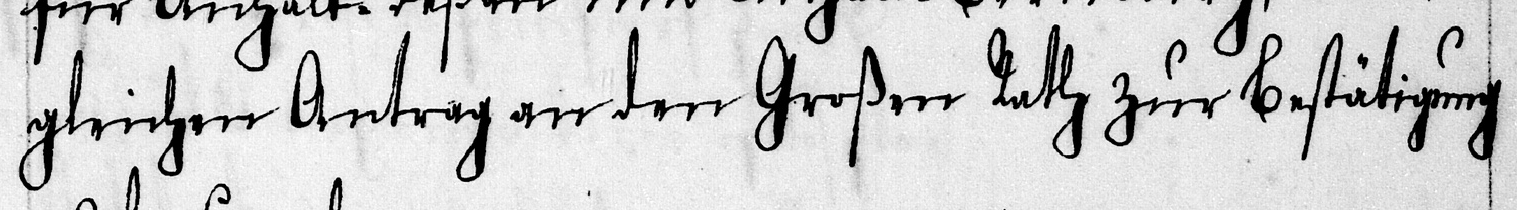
gleichen Antrag an den Großen Rath zur Bestätigung
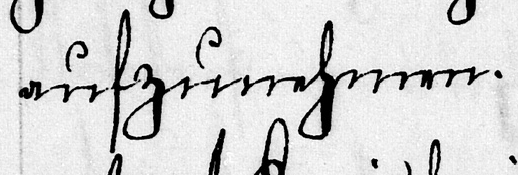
aufzunehmen.
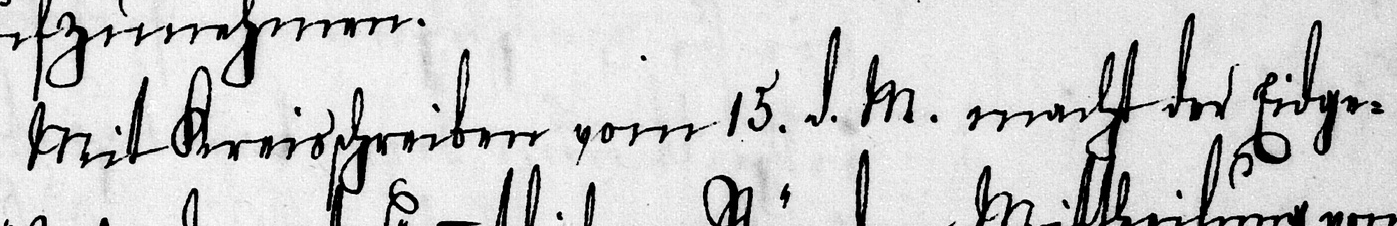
Mit Kreisschreiben vom 15. d. M. macht der Eidge¬
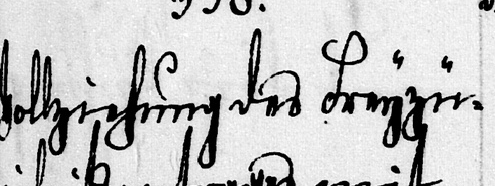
der Stände stel¬
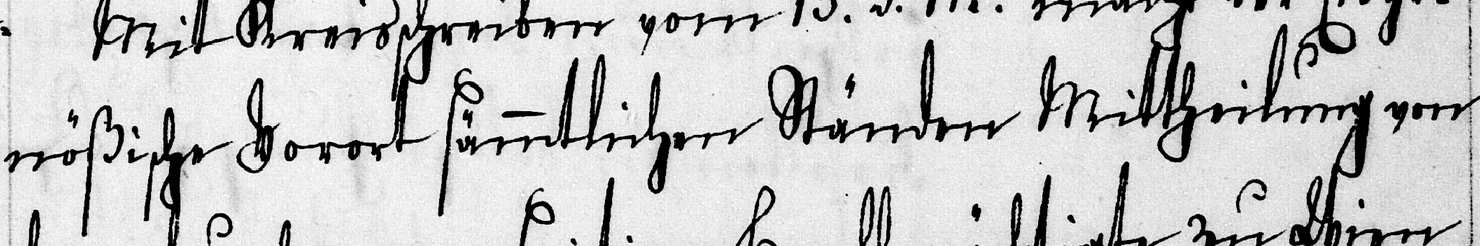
nößische Vorort sämmtlichen Ständen Mittheilung von
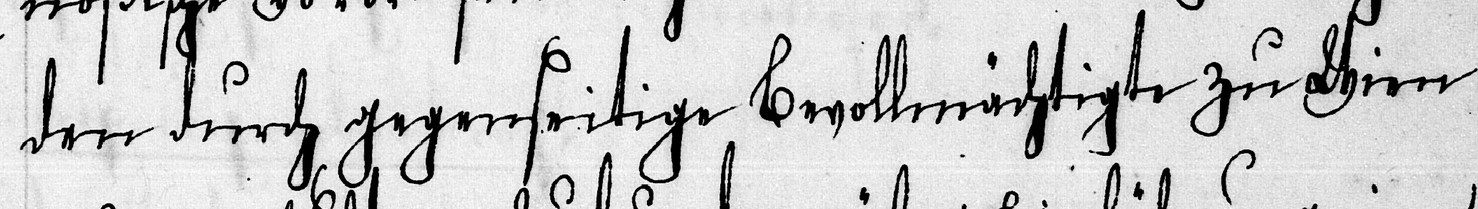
den durch gegenseitige Bevollmächtigte zu Wien
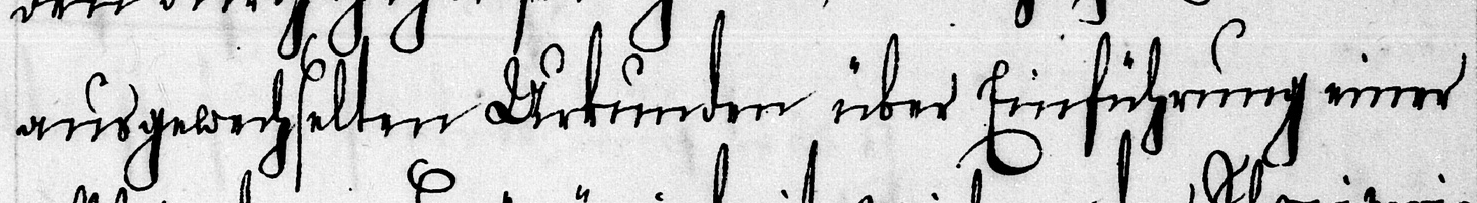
ausgewechselten Urkunden über Einführung einer
